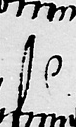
s¬
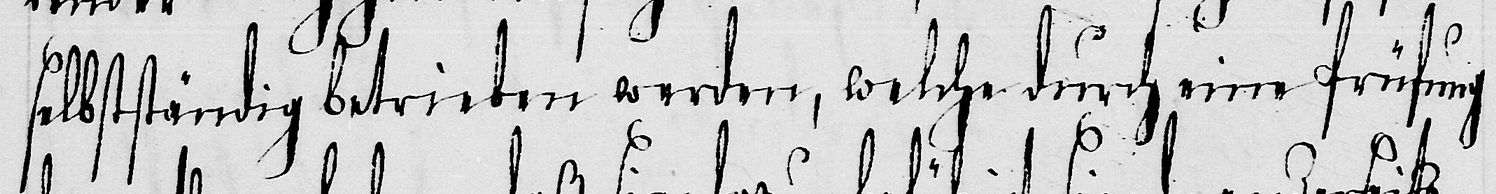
selbstständig betrieben werden, welche durch eine Prüfung
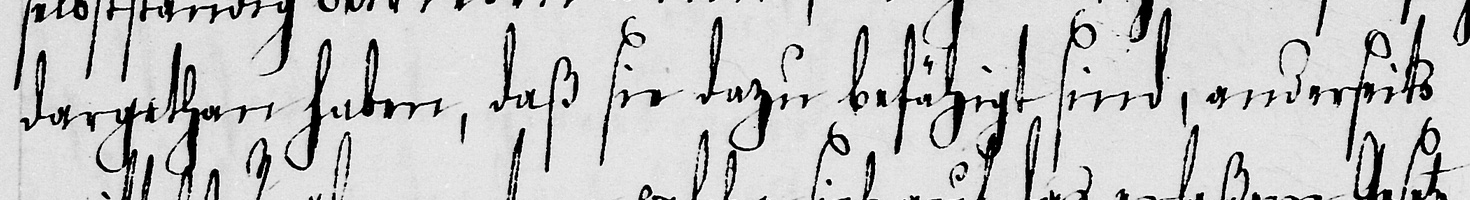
dargethan haben, daß sie dazu befähigt sind, anderseits
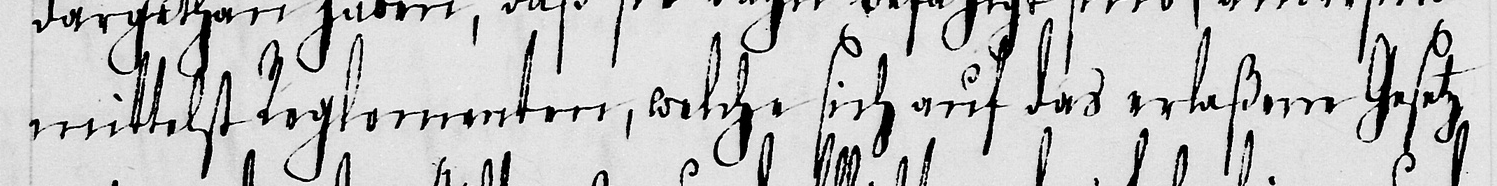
mittelst Reglementen, welche sich auf das erlaßene Gesetz
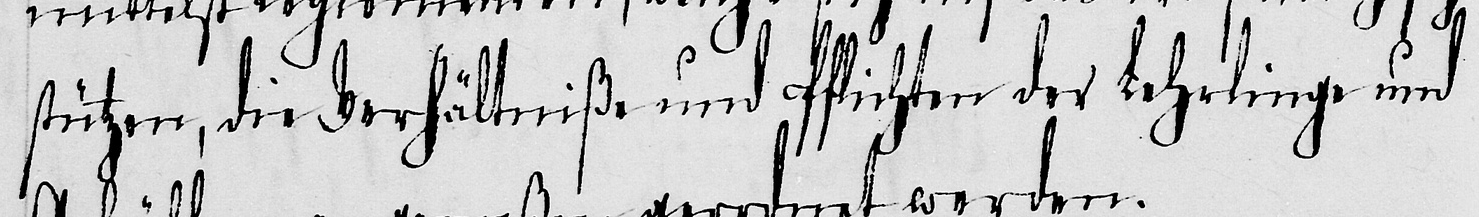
stützen, die Verhältniße und Pflichten der Lehrlinge und
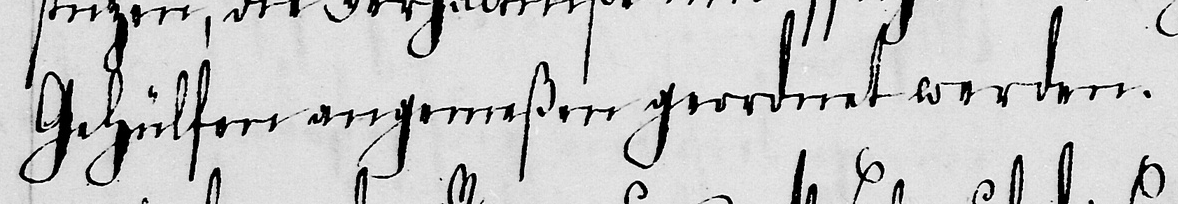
Gehülfen angemeßen geordnet werden.
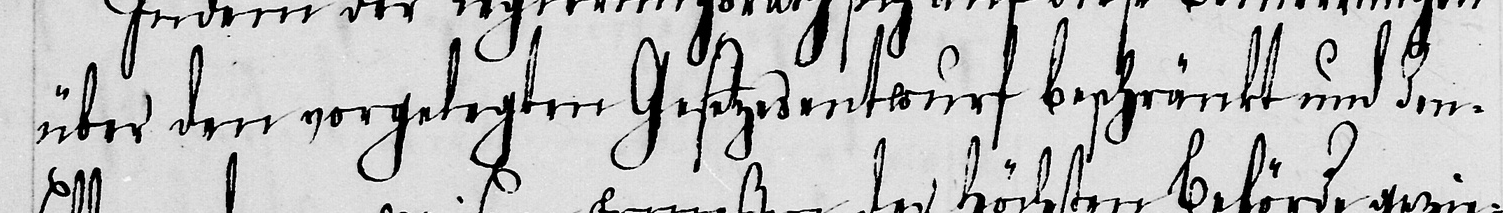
über den vorgelegten Gesetzesentwurf beschränkt und den¬
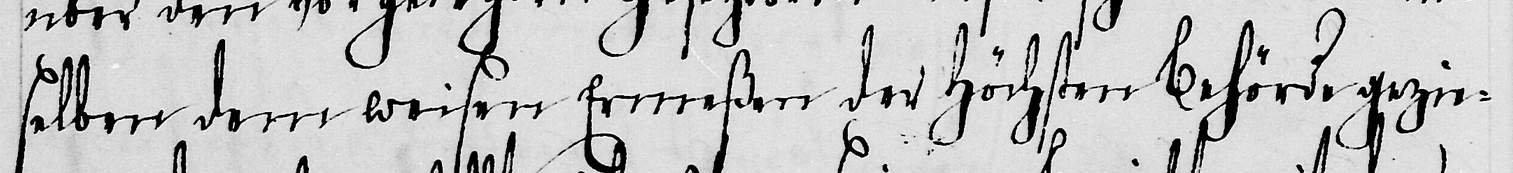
selben dem weisen Ermeßen der Höchsten Behörde gezie¬
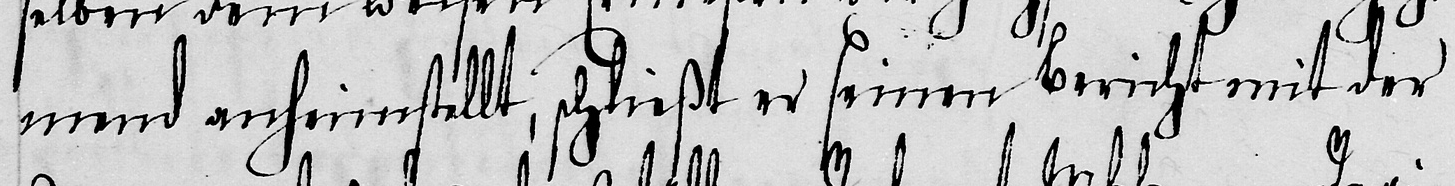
mend anheimstellt, schließt er seinen Bericht mit der
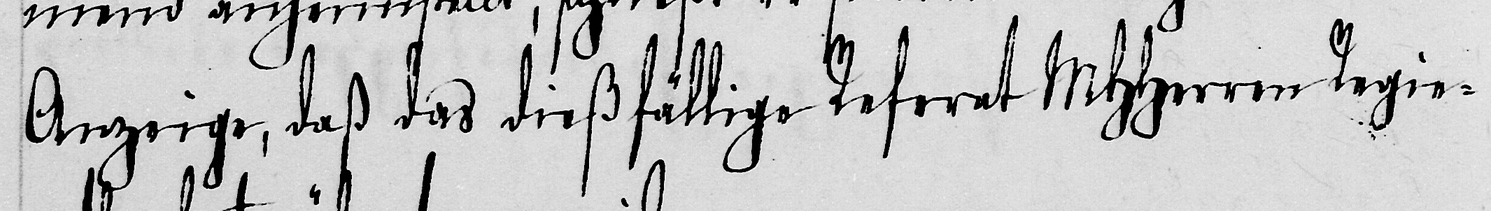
Anzeige, daß das dießfällige Referat MHHerren Regier¬
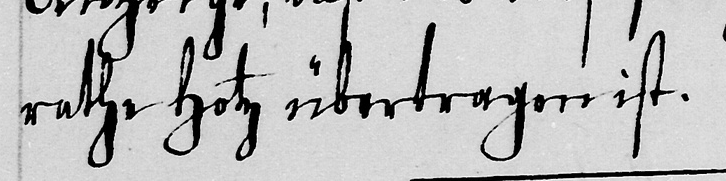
rathe Hotz übertragen ist.
